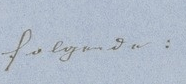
folgende:
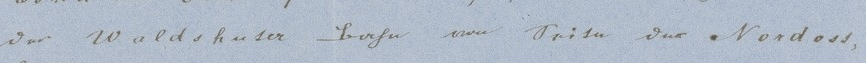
der Waldshuter Bahn von Seite der Nordost-
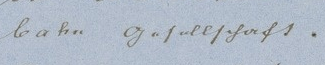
bahn Gesellschaft.
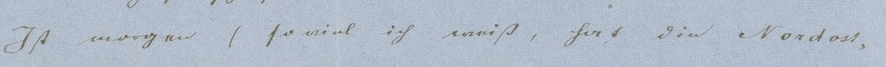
Ist morgen (soviel ich weiß, hat die Nordost-
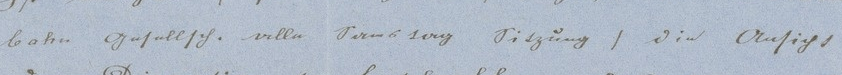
bahn Gesellsch. alle Samstag Sitzung) die Ansicht
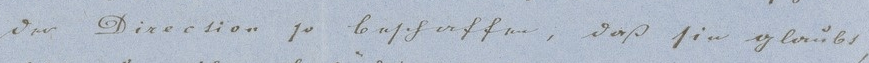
der Direction so beschaffen, daß sie glaubt,
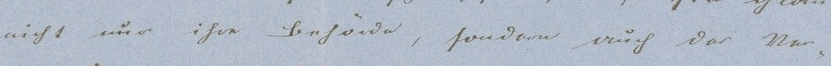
nicht nur ihre Behörde, sondern auch der Ver-
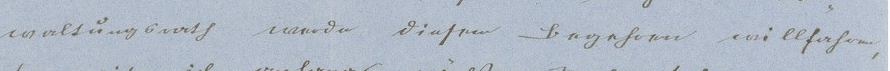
waltungsrath werde diesem Begehren willfahren,
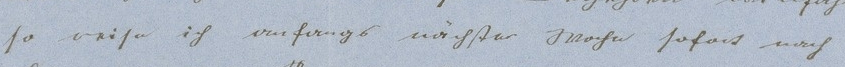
so reise ich anfangs nächster Woche sofort nach
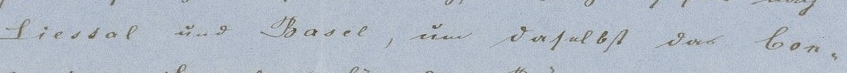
Liestal und Basel, um daselbst das Con-
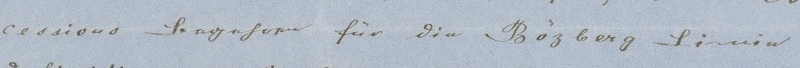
cessions Begehren für die Bözberg Linie
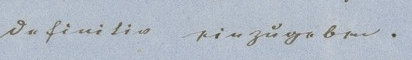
definitiv einzugeben.
